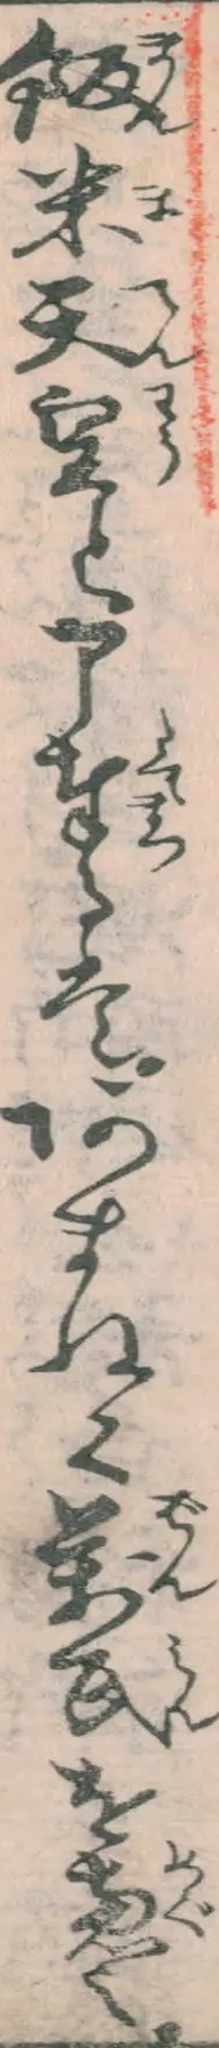飯米天皇と申奉るなし。あまねく萬民を惠也。
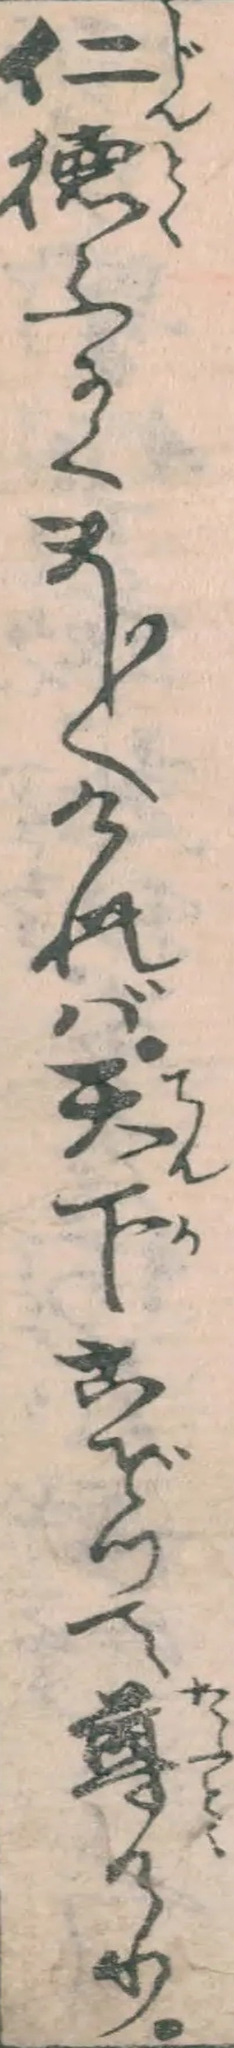人徳ふかくまし〳〵ければ。天下こぞつて尊けり。

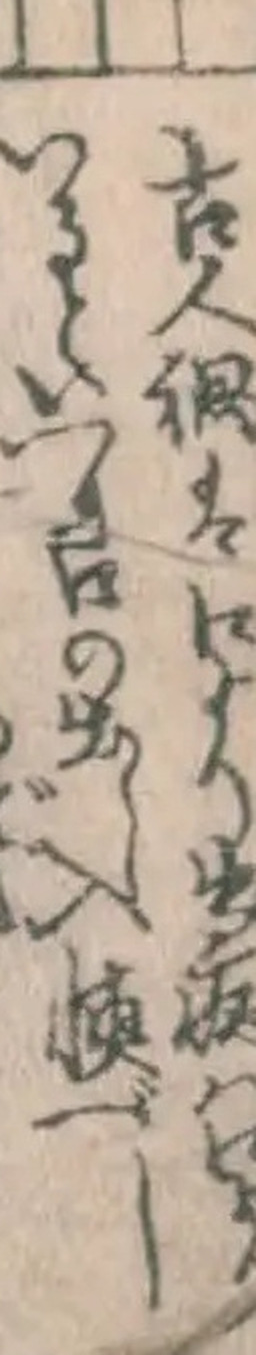いるとて口の出し入慎べし
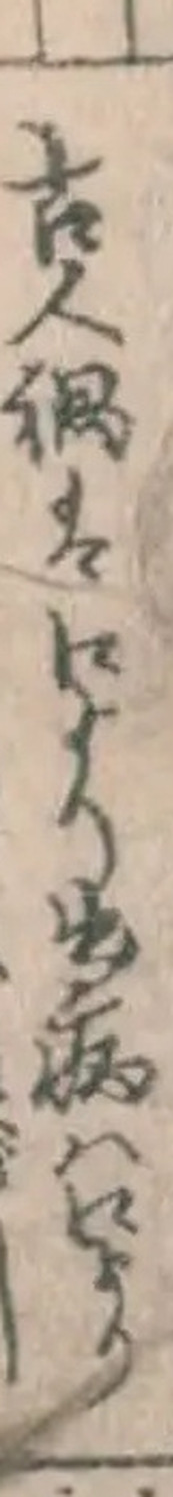古人猧は口より出病は口より
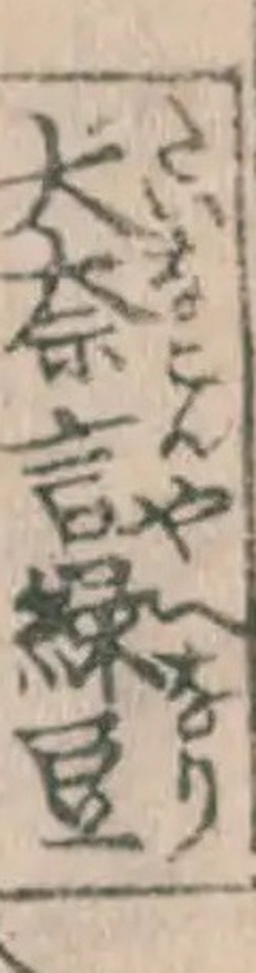大納言緑豆
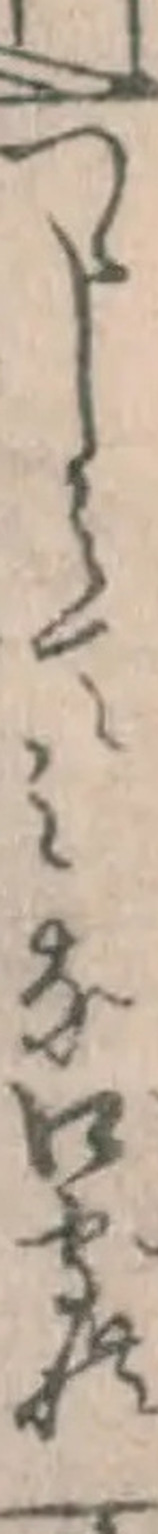つゝしみてみな口守れ
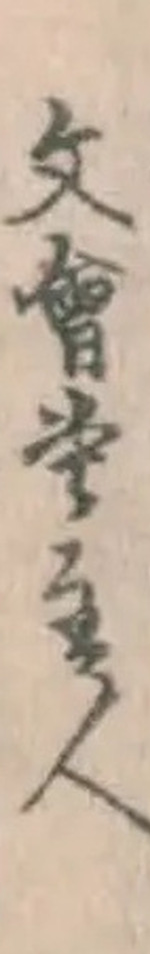文會堂主人
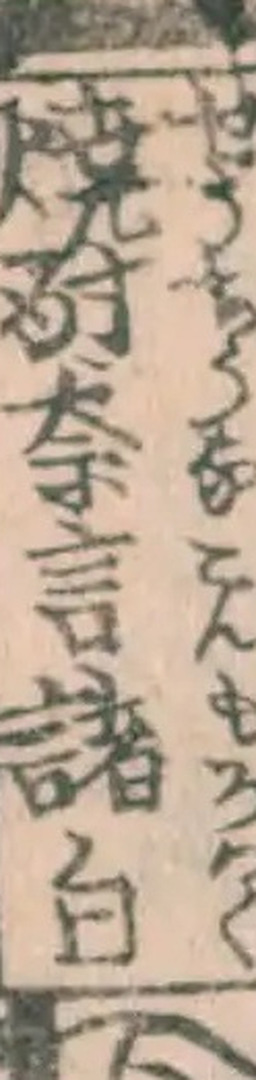焼酎奈言諸白
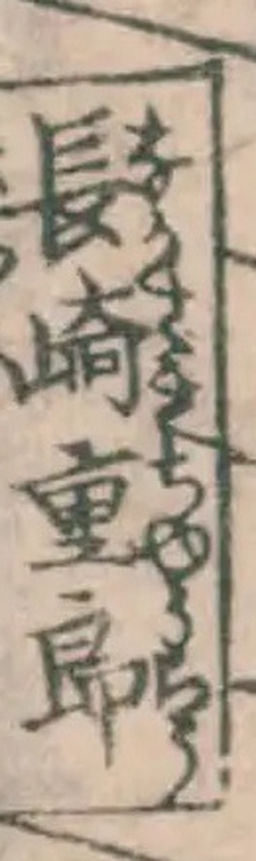長崎重郎
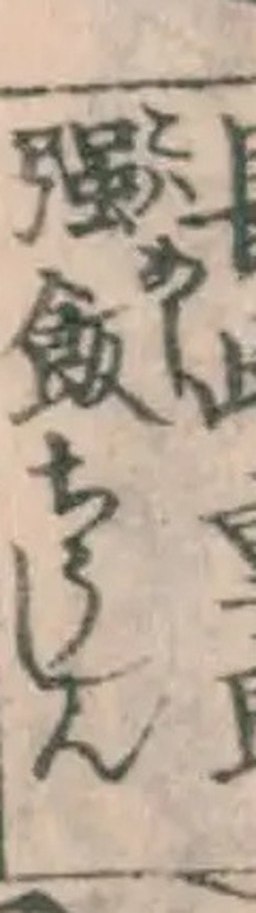強飯ちうしん

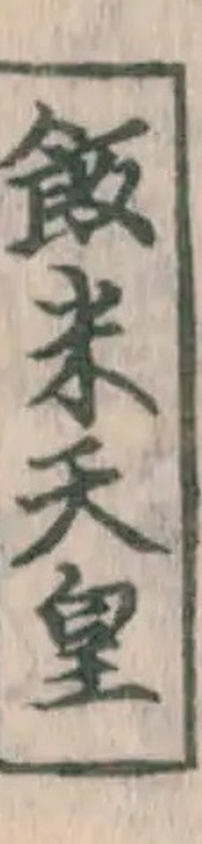飯米天皇
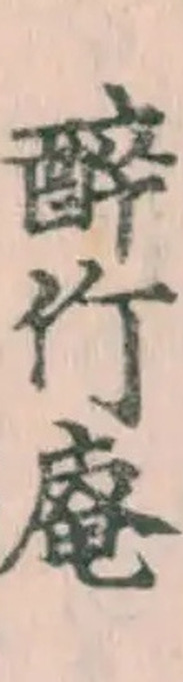醉竹庵
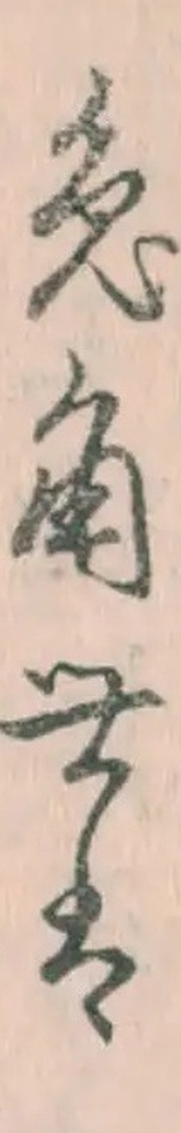兎角世は
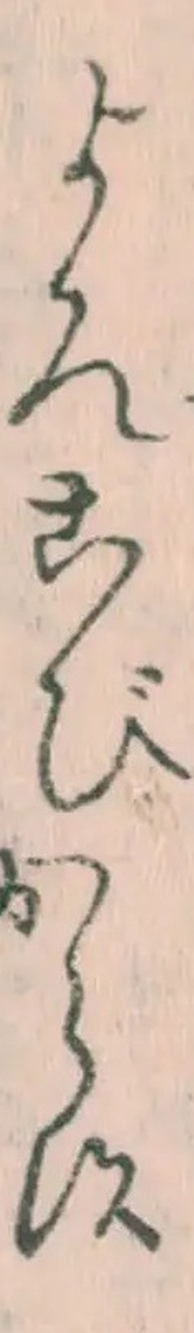よろこびからす
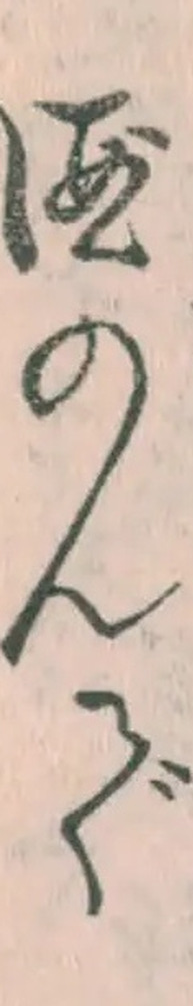酒のんで
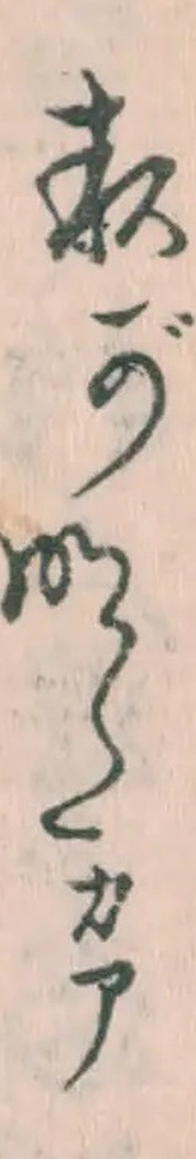夜が明たカア
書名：滑稽五穀太平記 2巻
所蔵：国立国会図書館 National Diet Library, JAPAN
